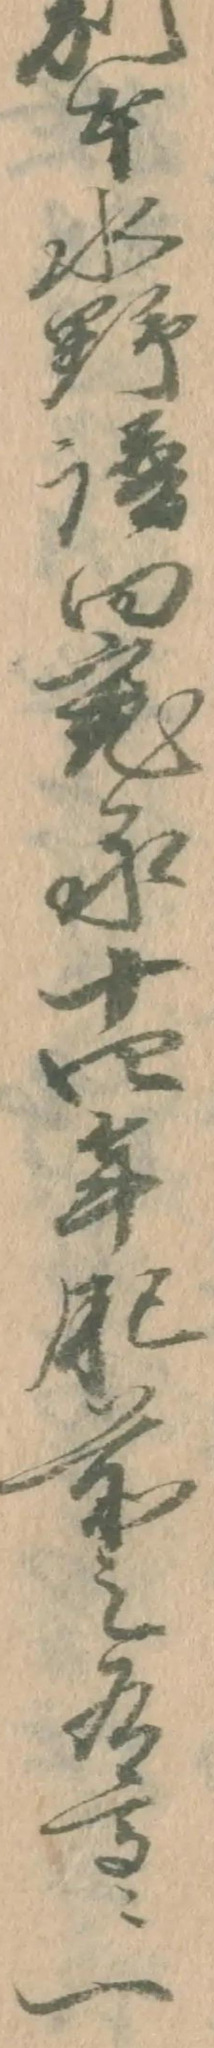別本水野譜曰寛永十四年肥前之有馬に一

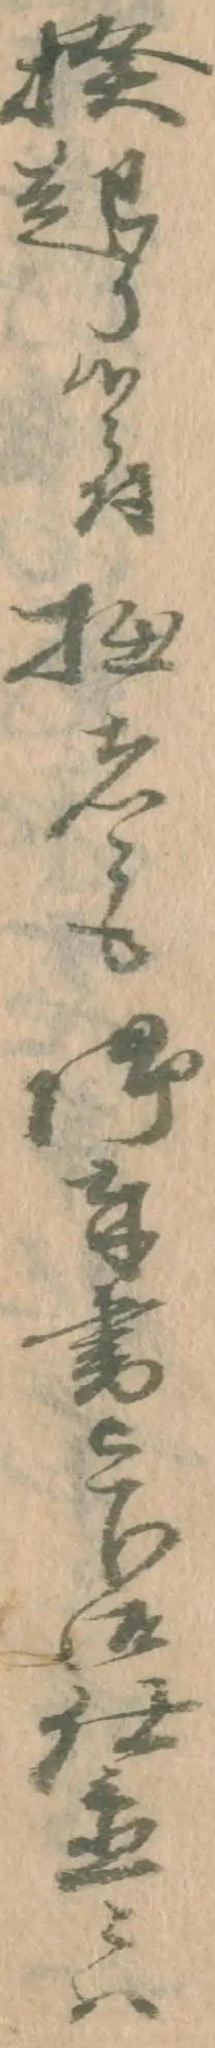揆起り候に付拙者にも御奉書被下御仕直には
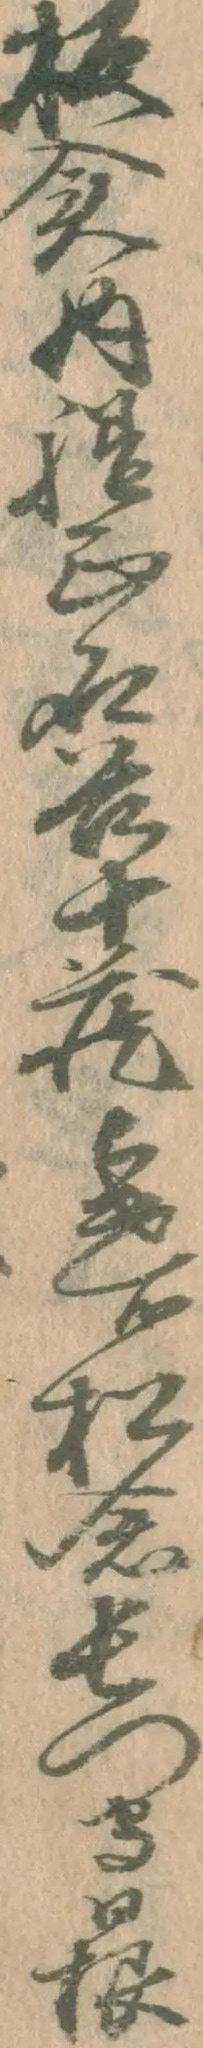板倉内膳正石谷十蔵被遣候松倉長門守日根
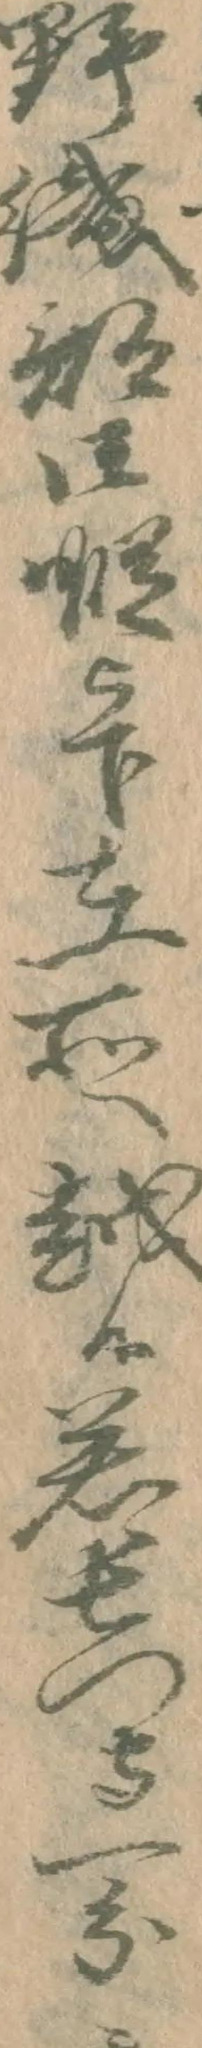野織部御順被下在所へ越候若長門守一分に
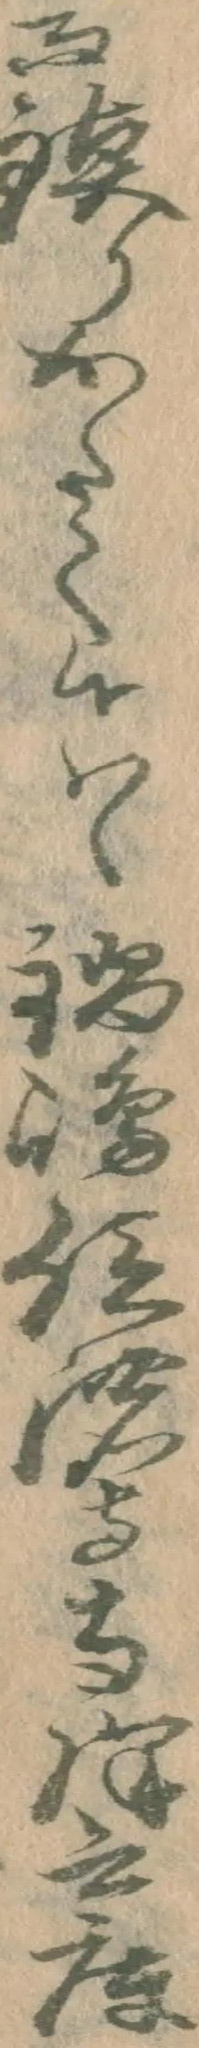而鎮りかたく候はゝ鍋島信濃守寺沢兵庫
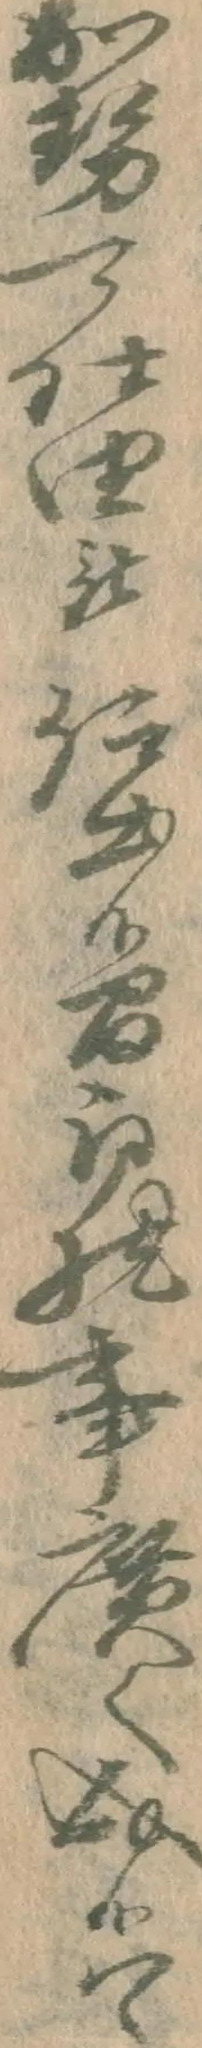加勢可仕由被仰出候間自然事広く成候はゝ
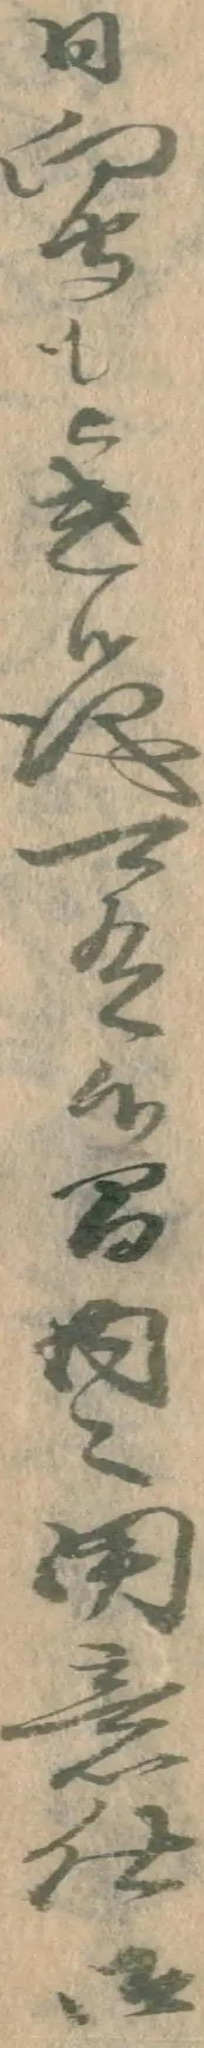日向守も被遣候儀可有候間内々用意仕御
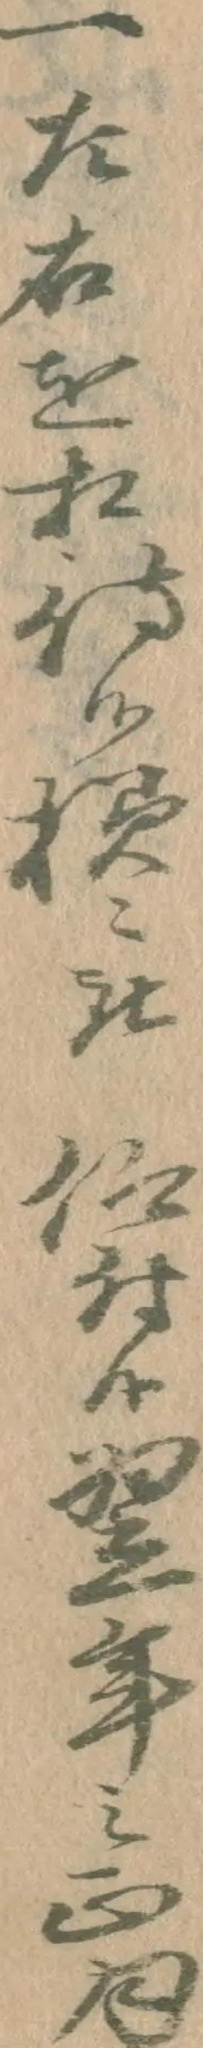一左右を相待候様に被仰付候翌年之正月
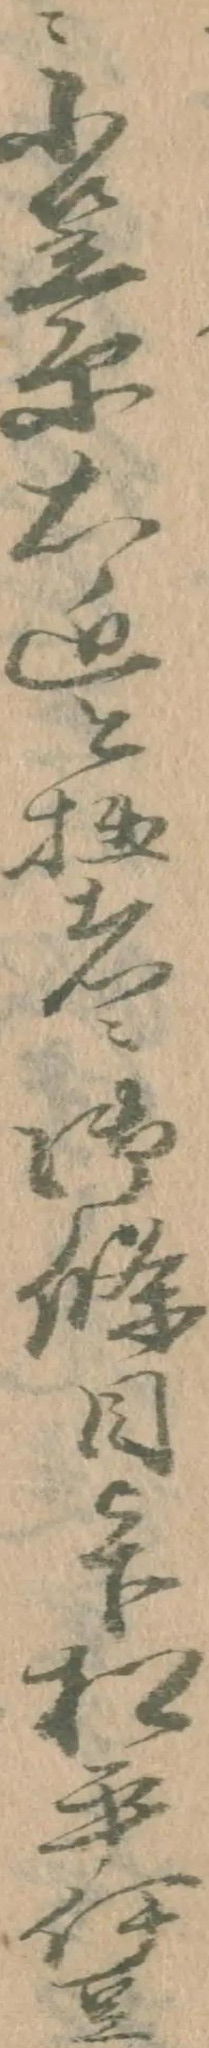に小笠原右近と拙者に御條目被下松平伊豆
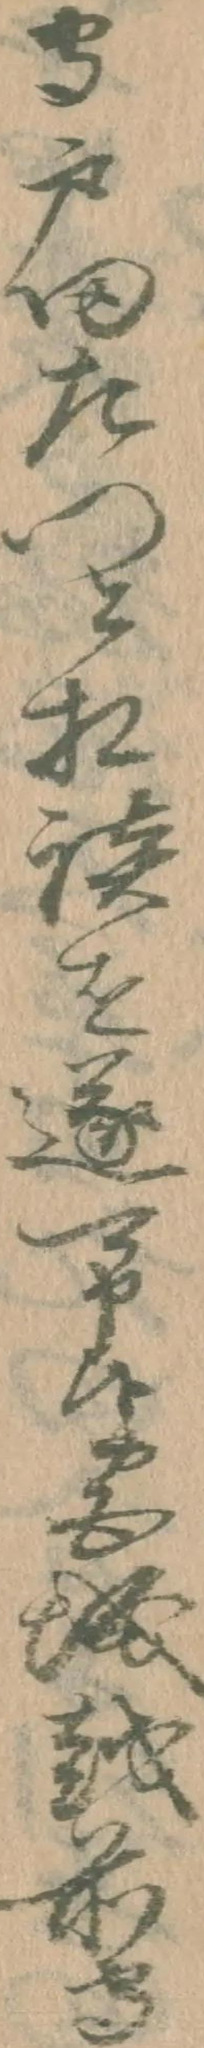守戸田左門と相談を遂可申候宮城越前守
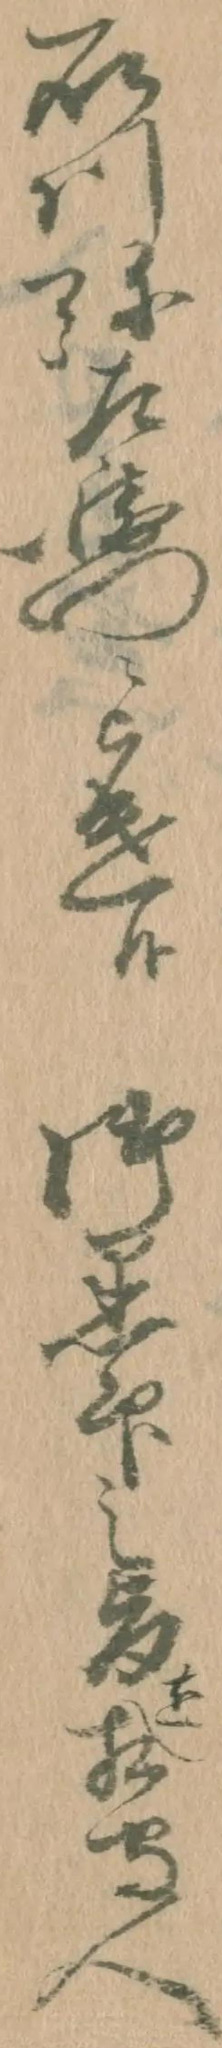石川弥左衛門被遣候御黒印之旨を相守人
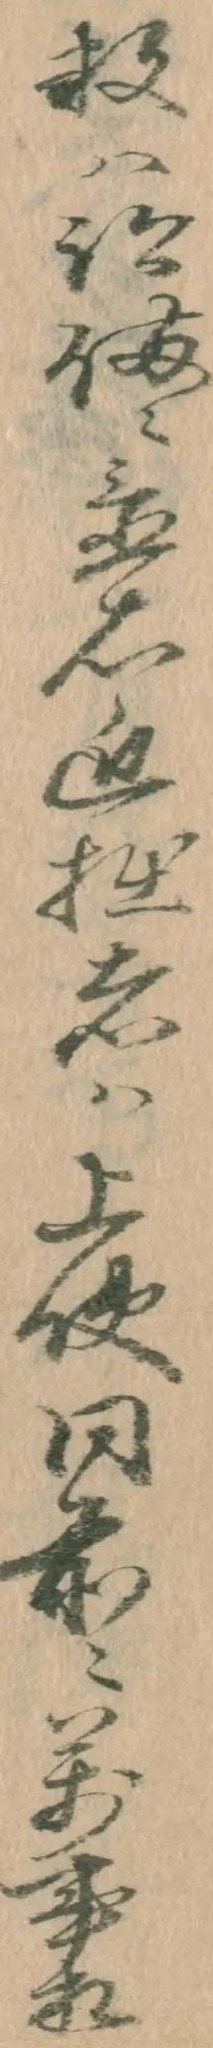数は跡備に置右近拙者は上使同前に万事相
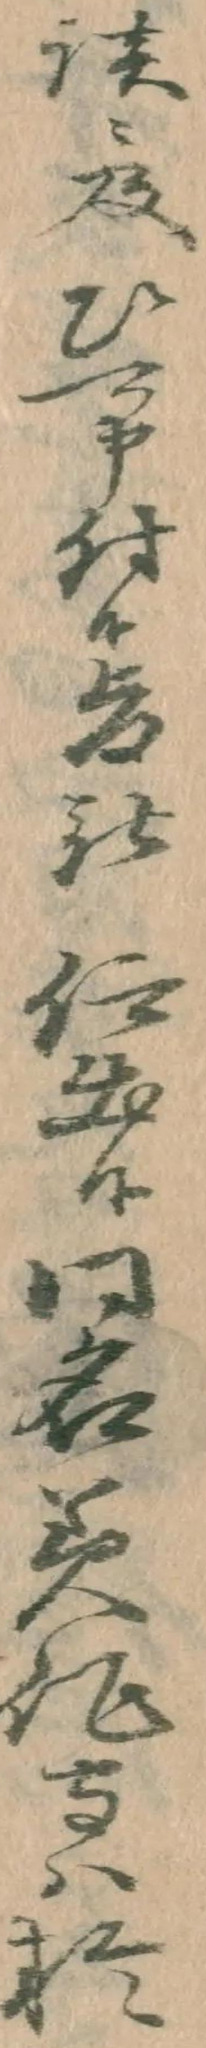談に及ひ可申付候旨被仰出候同名美作守は於
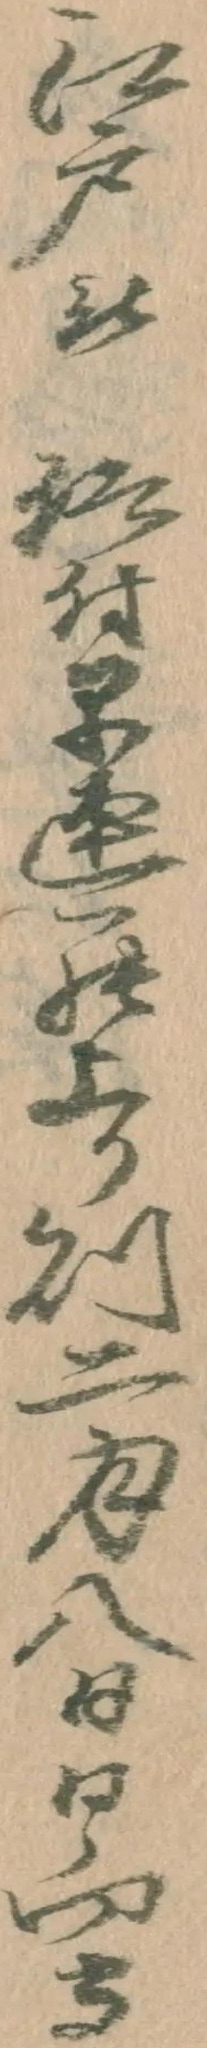江戸被仰付早速罷上り則二月八日日向守
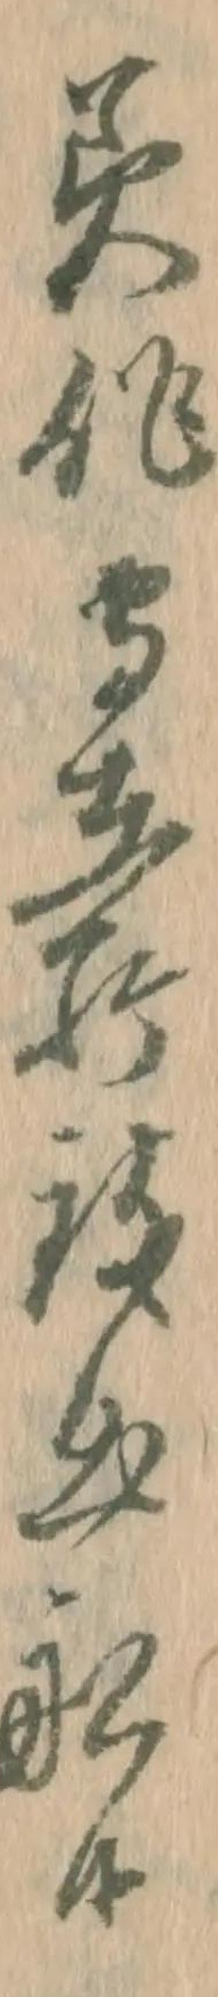美作守在所致出舩候
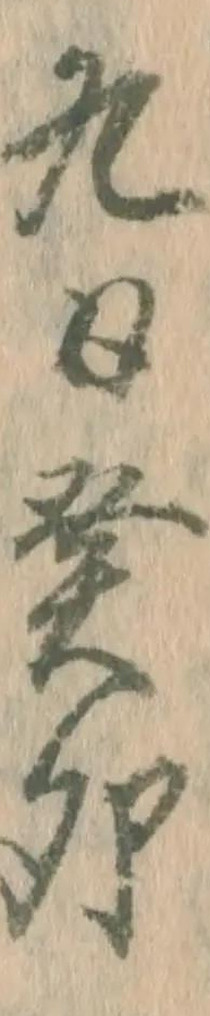九日癸夘
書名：切支丹御退治記 49巻. [6]
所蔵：国立国会図書館 National Diet Library, JAPAN
